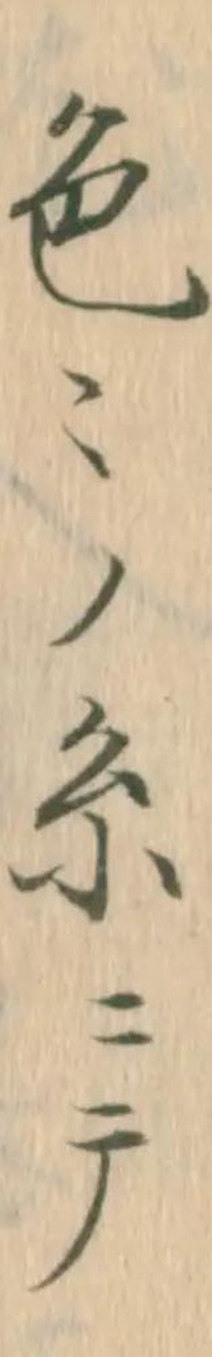色々ノ糸ニテ
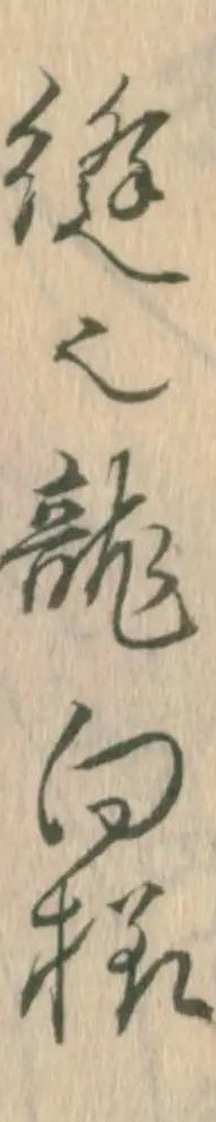縫也龍向様
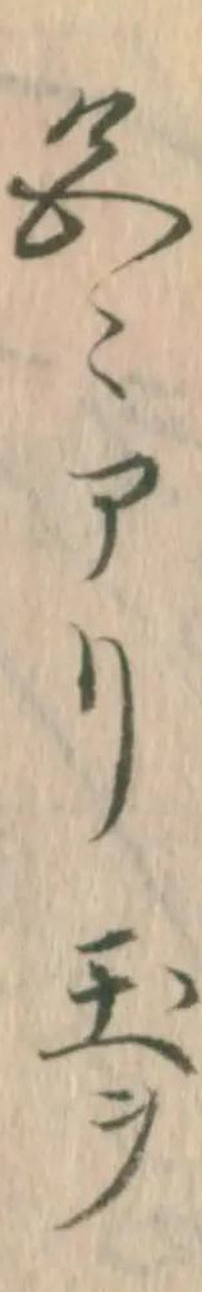色々アリ玉ヲ前
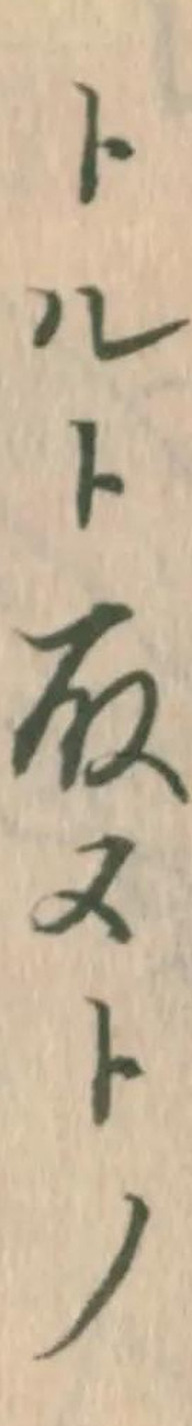トルト取ヌトノ
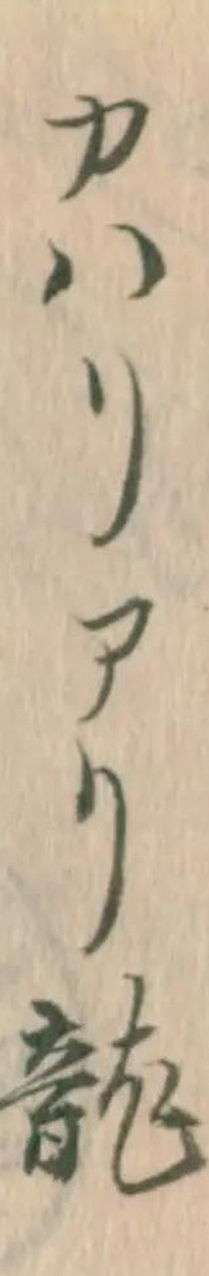カハリアリ龍
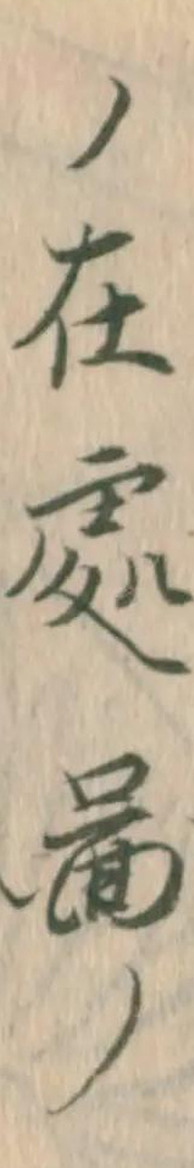ノ在処図ノ
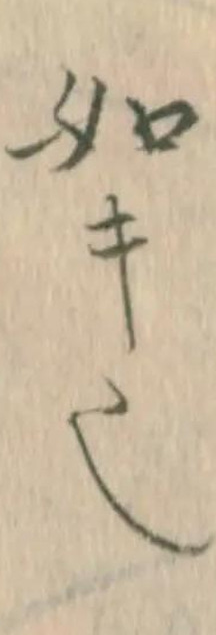如キ也

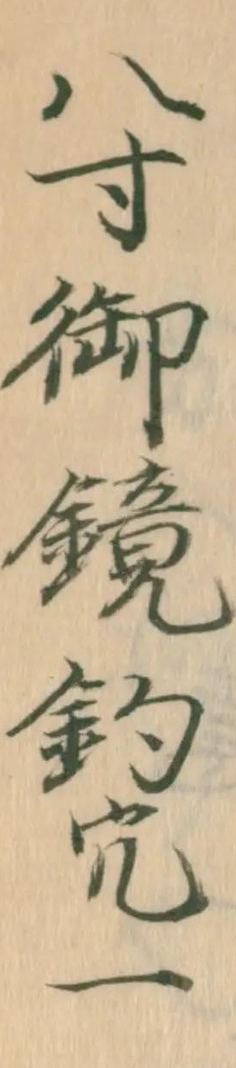八寸御鏡釣穴一
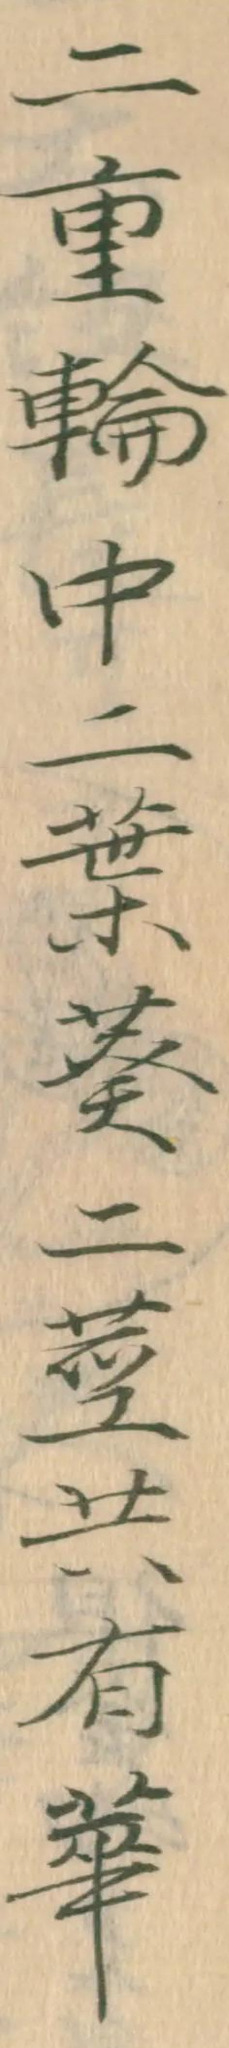二重輪中二葉葵二茎共有華
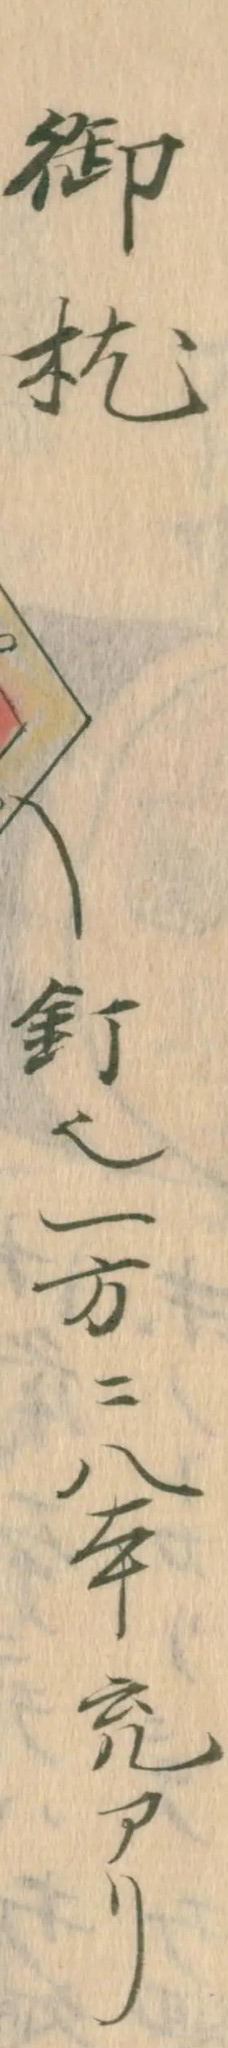御枕釘也一方ニ八本充アリ
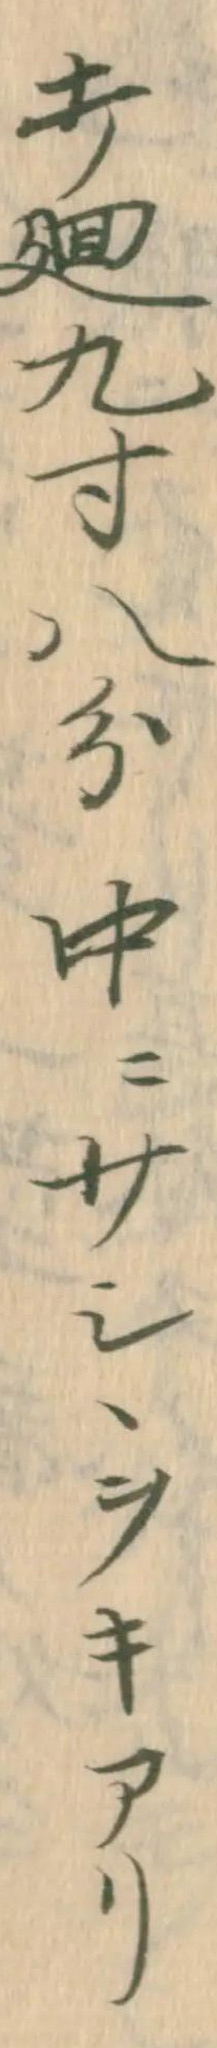打廻九寸八分中ニ少シヽヲキアリ
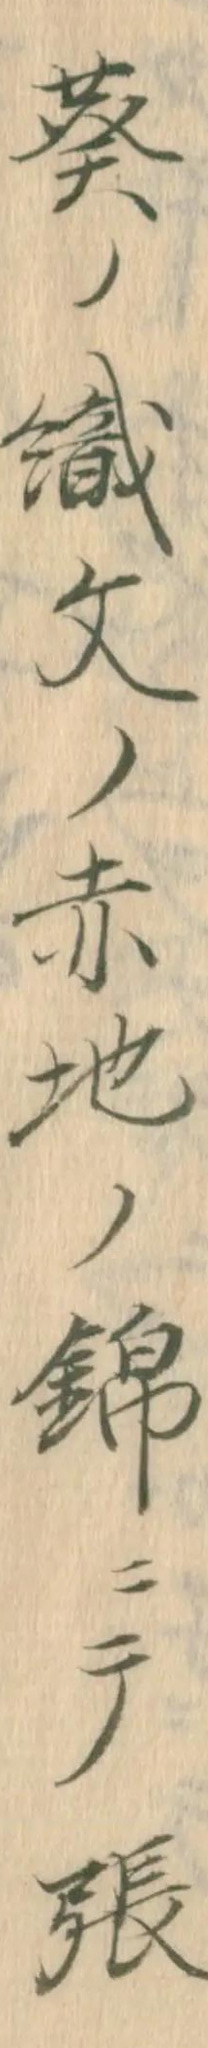葵ノ織文ノ赤地ノ錦ニテ張
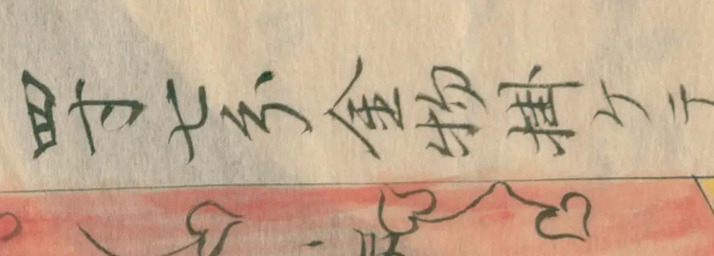四寸七分金物掛ケテ
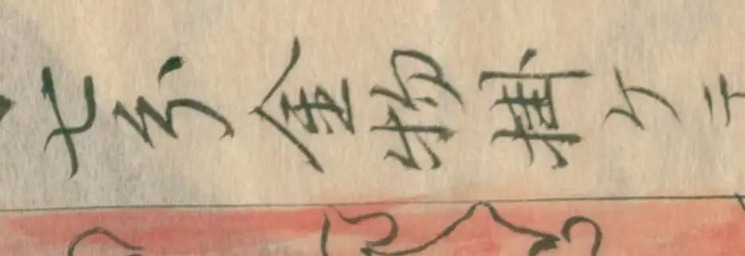四寸七分金物掛ケテ
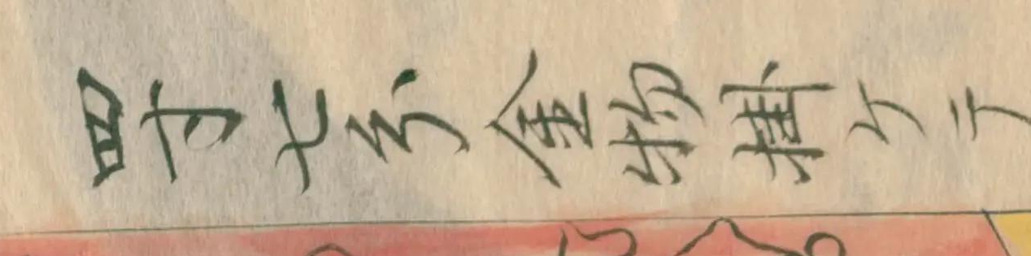四寸七分金物掛ケテ
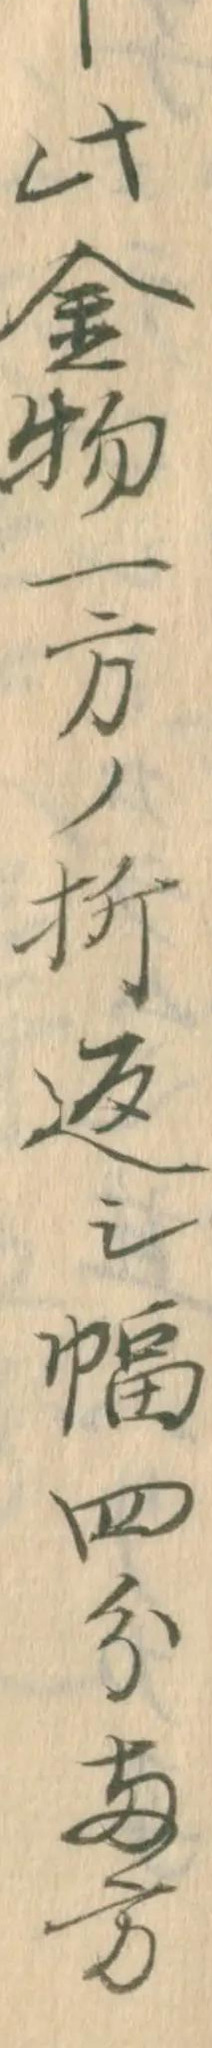此金物一方ノ折返シ幅四分両方
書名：賀茂社記録. 第15冊
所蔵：国立国会図書館 National Diet Library, JAPAN
